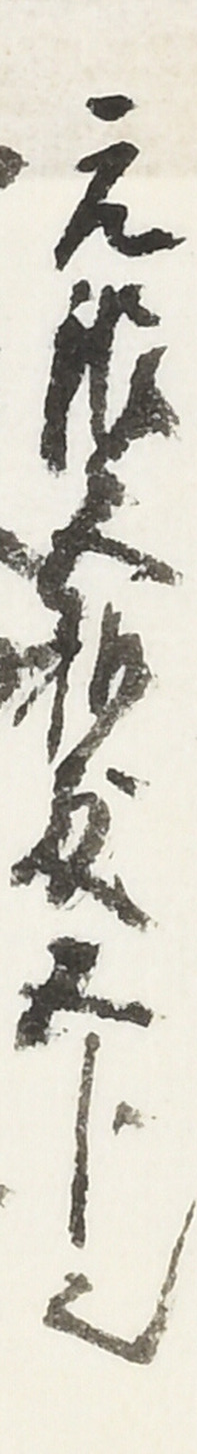元銀五拾匁五分也
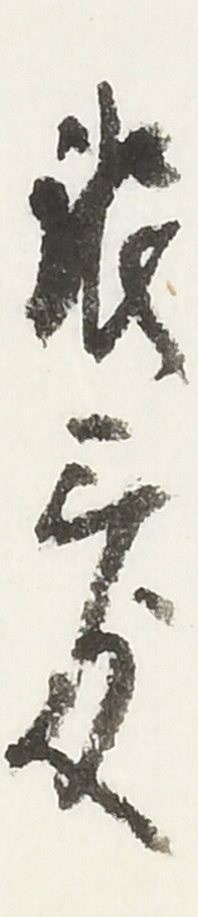銀三匁
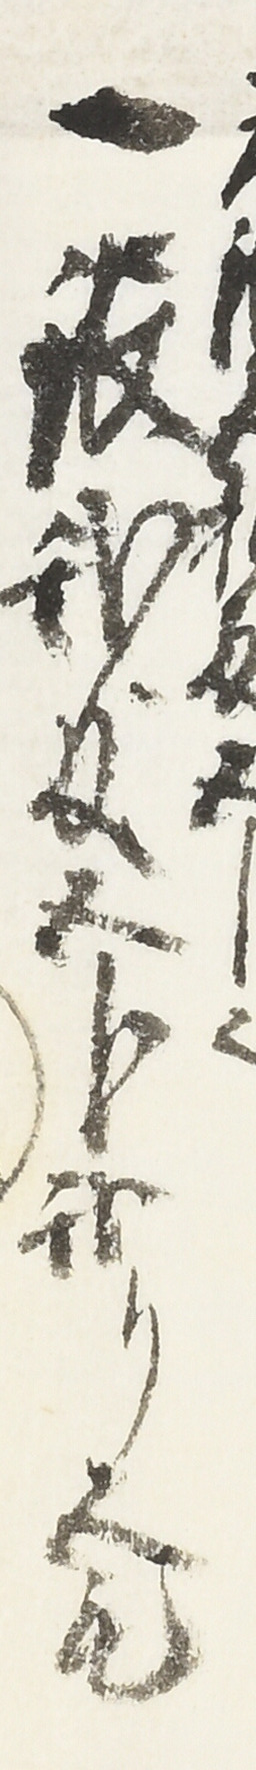一銀弐匁五分弐厘五毛
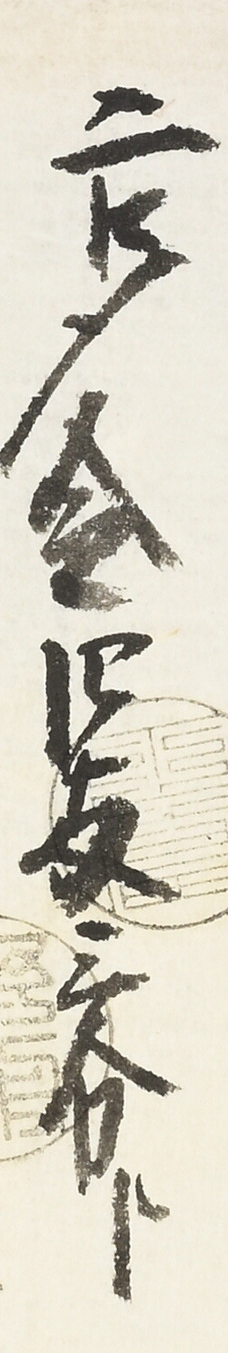二口〆金四両三分ト
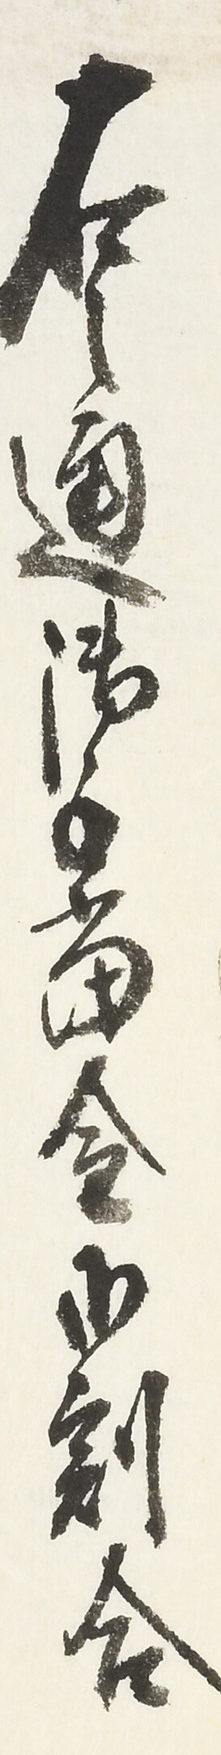右之通御手当金御割合
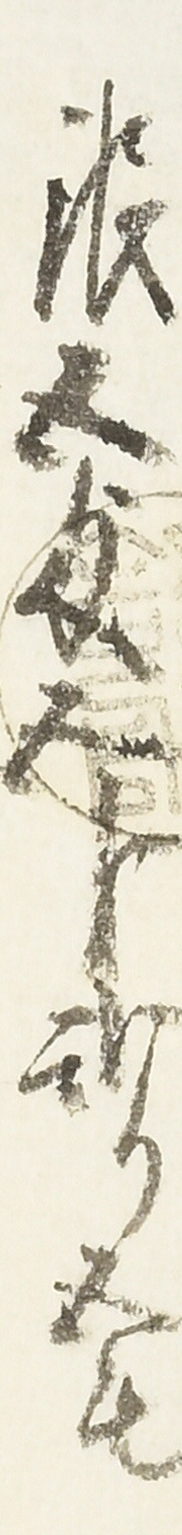銀五匁五分弐厘五毛
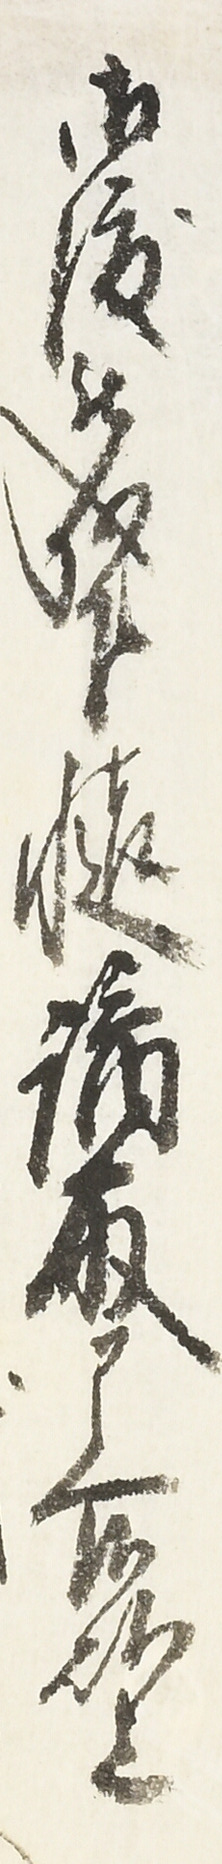御渡被成下慥請取申上候以上
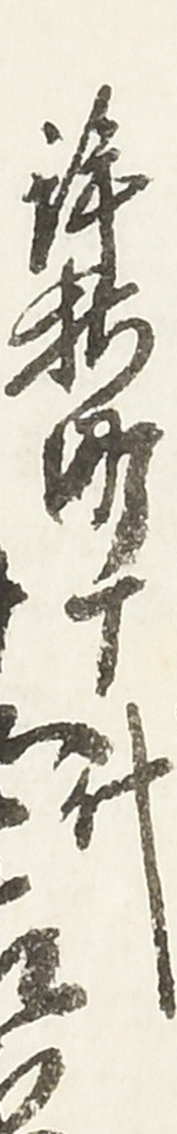鉾持町丁代
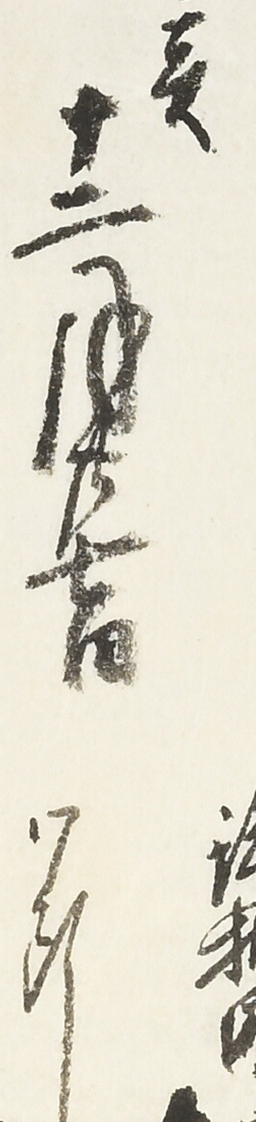十二月廿七日同断
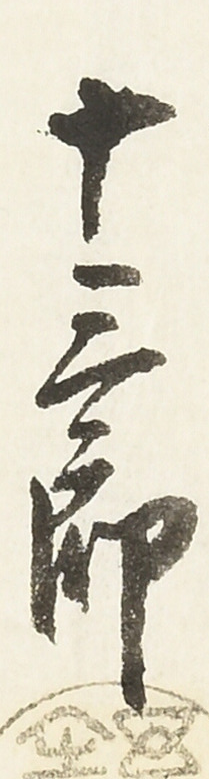十三郎
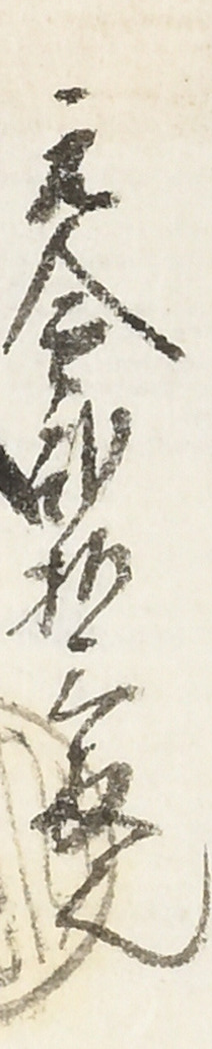元金弐拾三両也
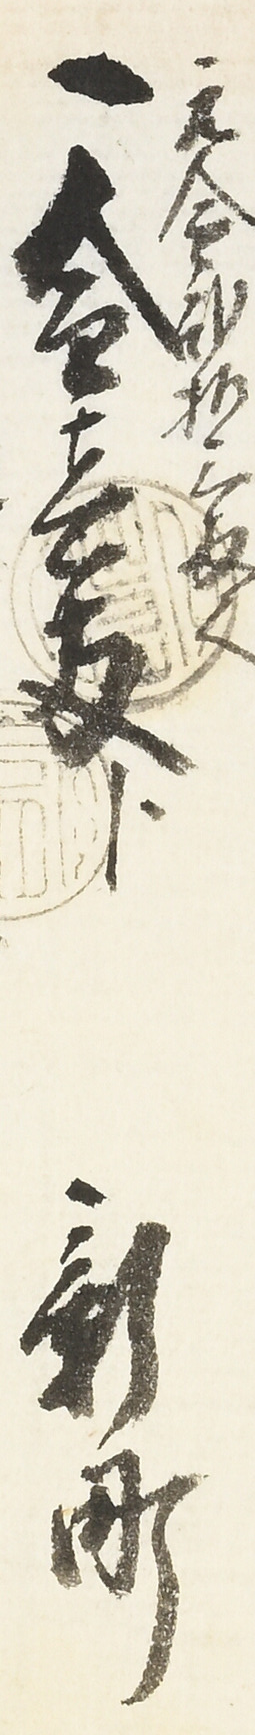一金壱両ト新町
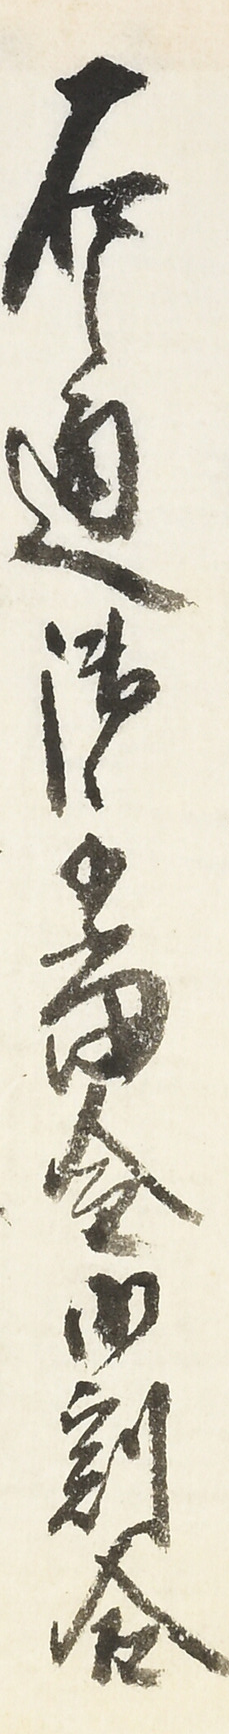右之通御手当金御割合
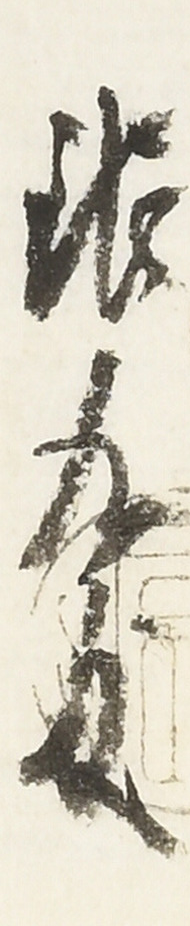銀九匁
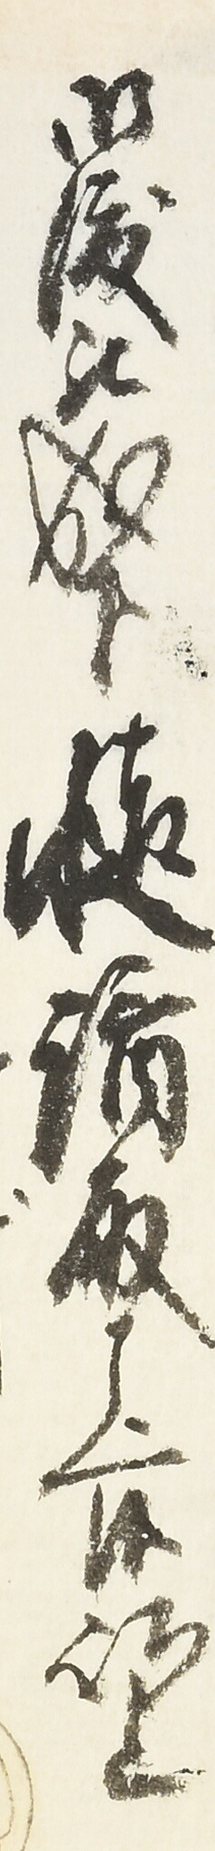御渡被成下慥請取申上候以上
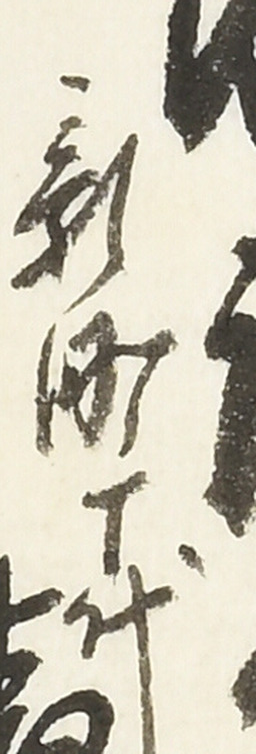新町丁代
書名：御才覚金御利足割渡扣帳
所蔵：伊那市立高遠町図書館・合同会社AMANE
